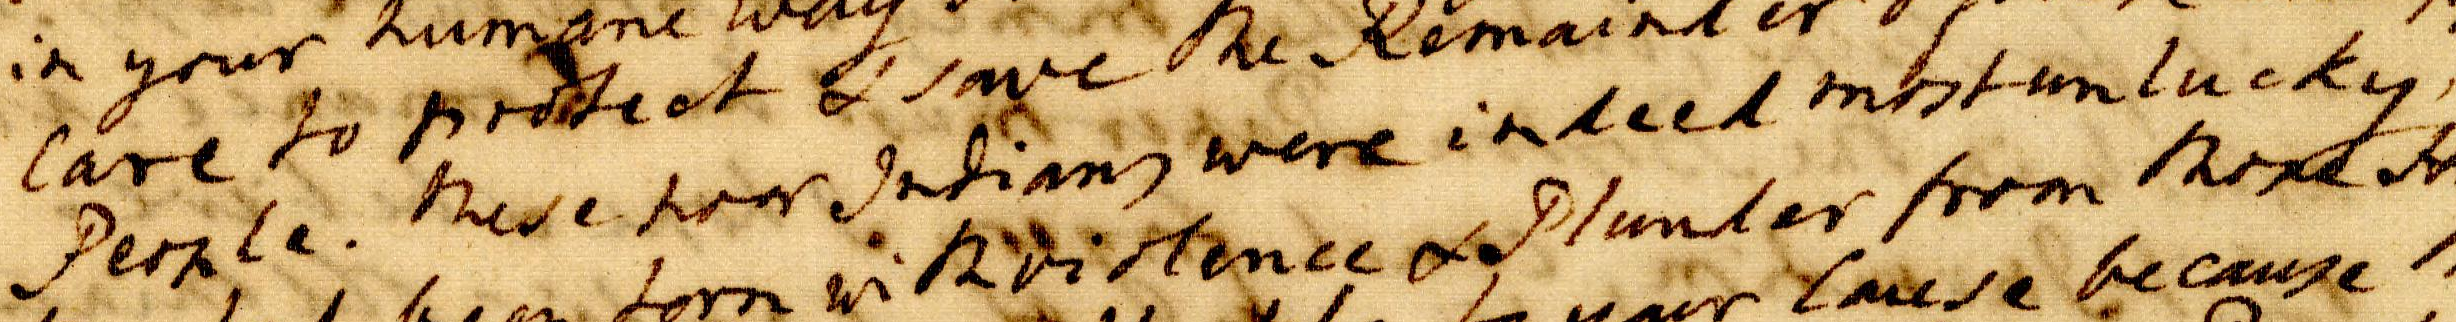People. these poor Indians were indeed most unlucky,
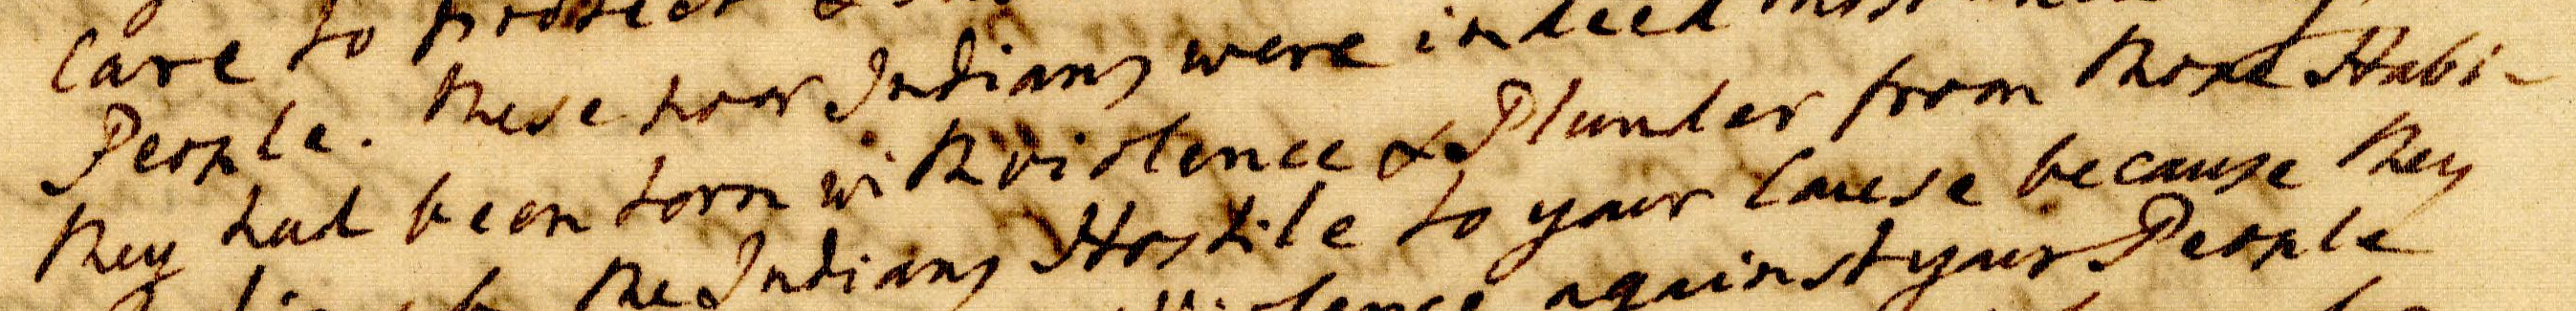they had been torn in Resistence & Plunder from those Habi-
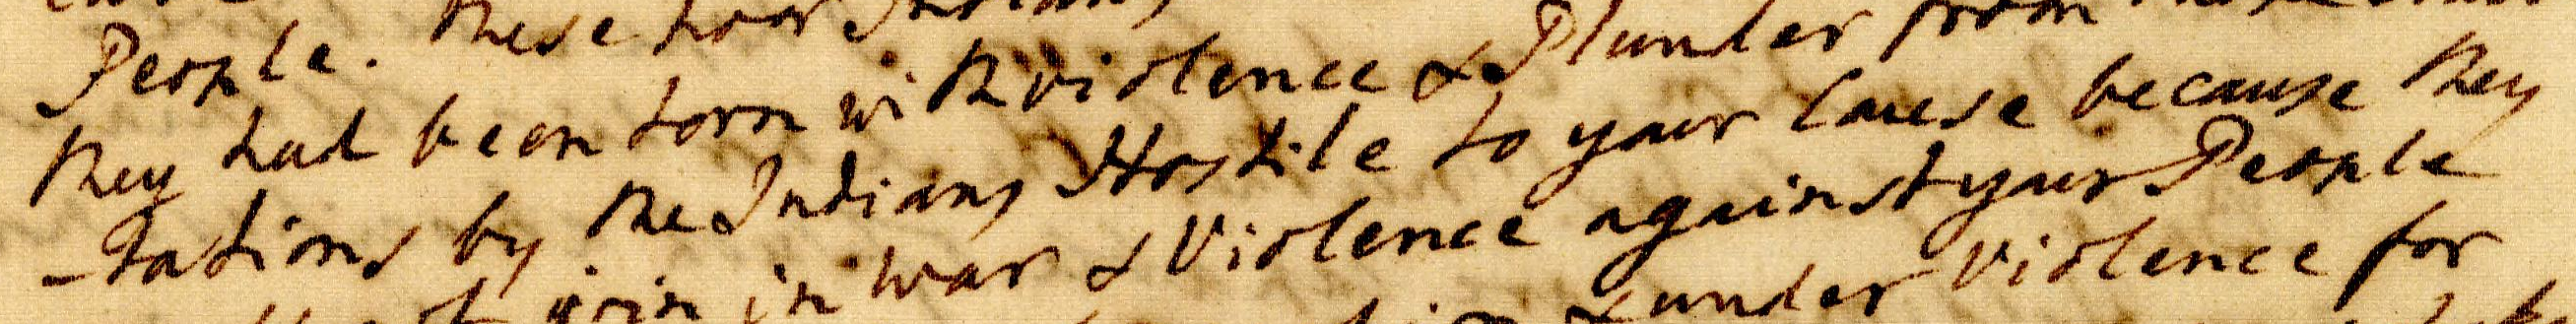-tations by the Indians Hostile to you Cause because they
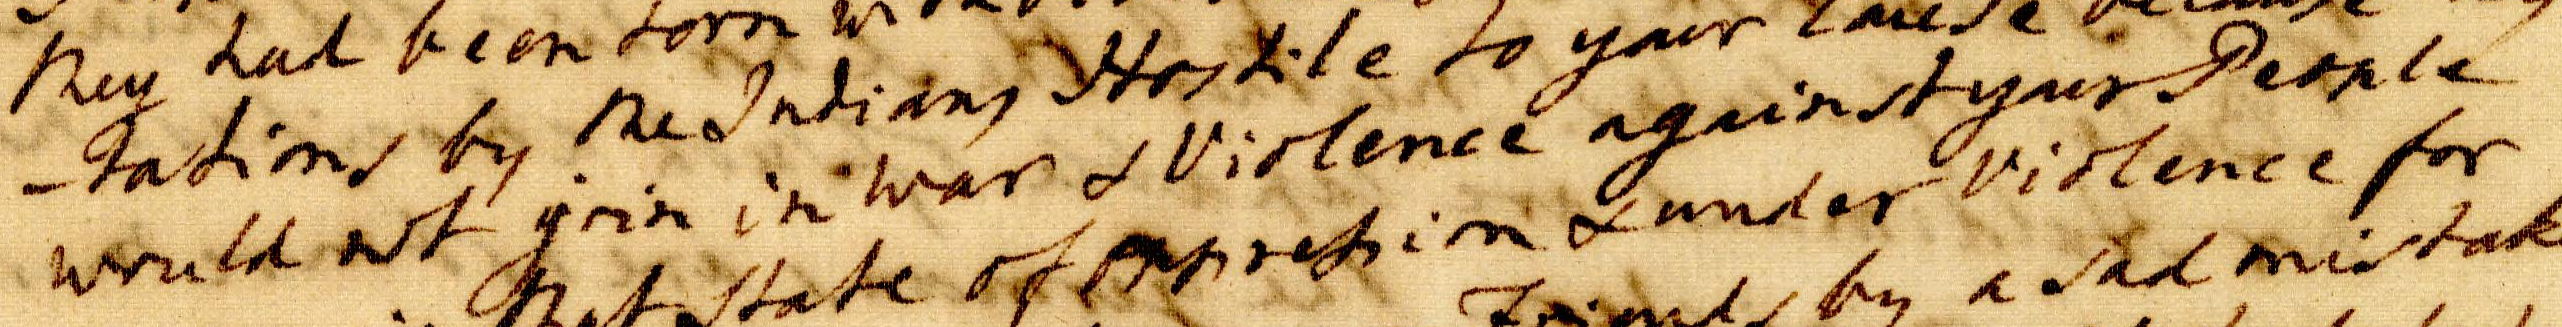would not join in war & Violence against your People
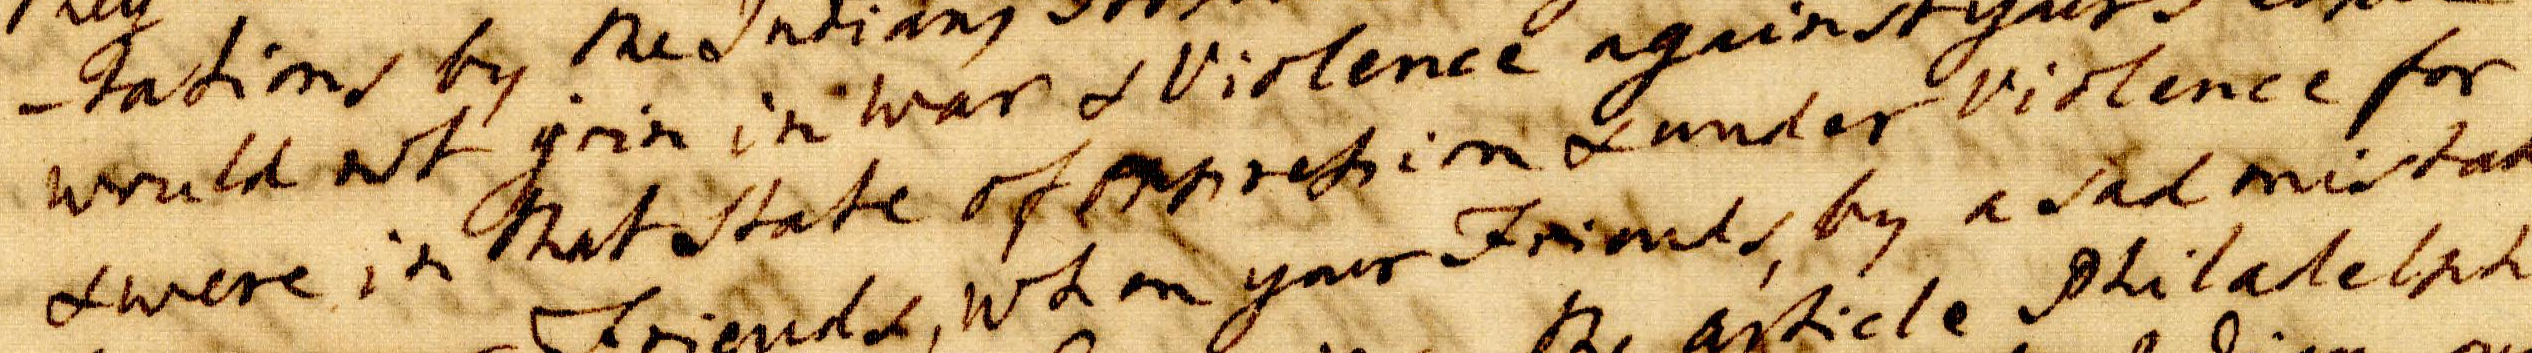& were in that state of oppression & under violence for
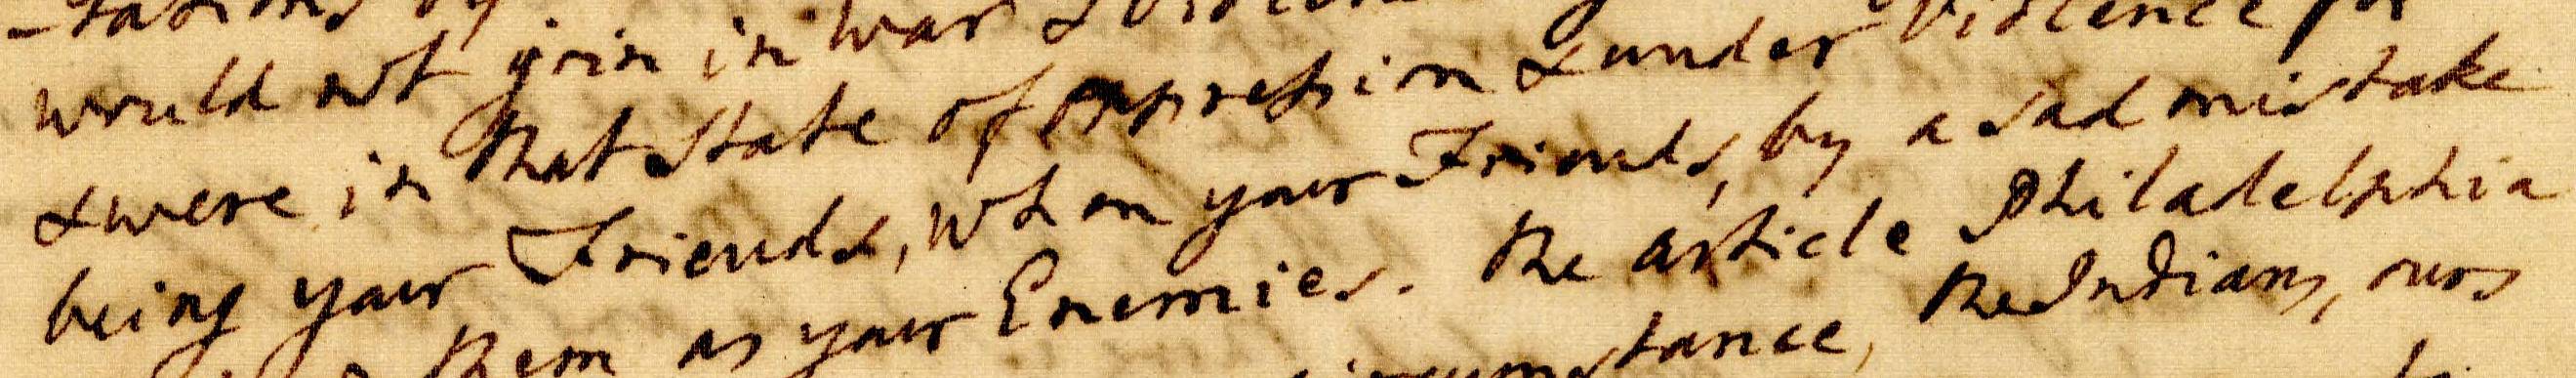being your Friends, when your Friends, by a sad mistake
